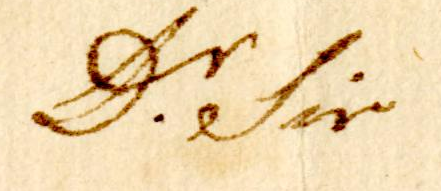D^r. Sir
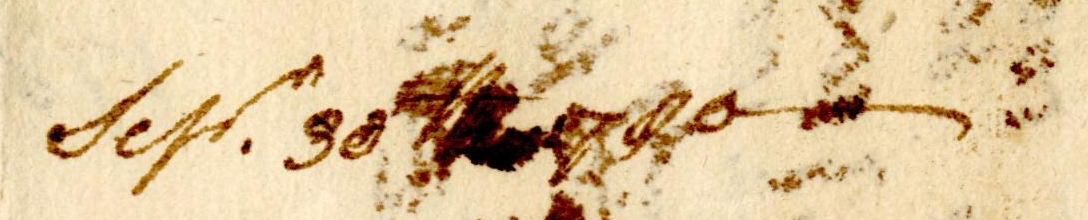Sep^r. 30^th 1780
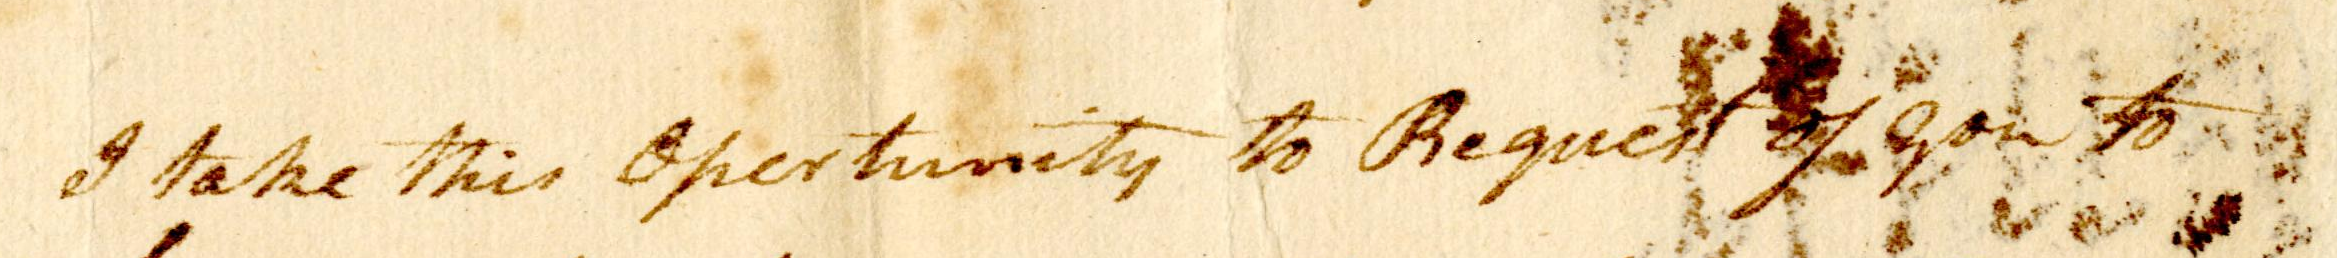I take this Opertunity to Request of you to
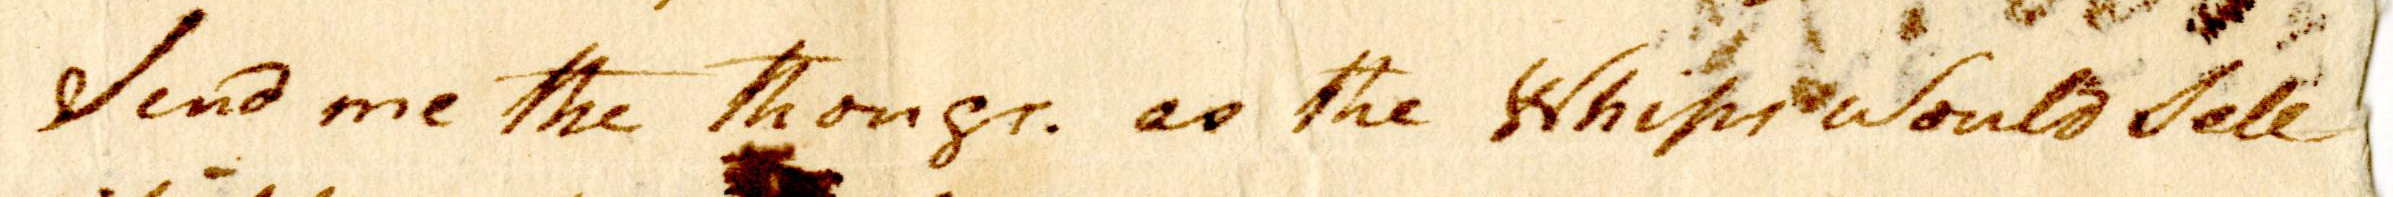send me the thongs as the Whips would sell
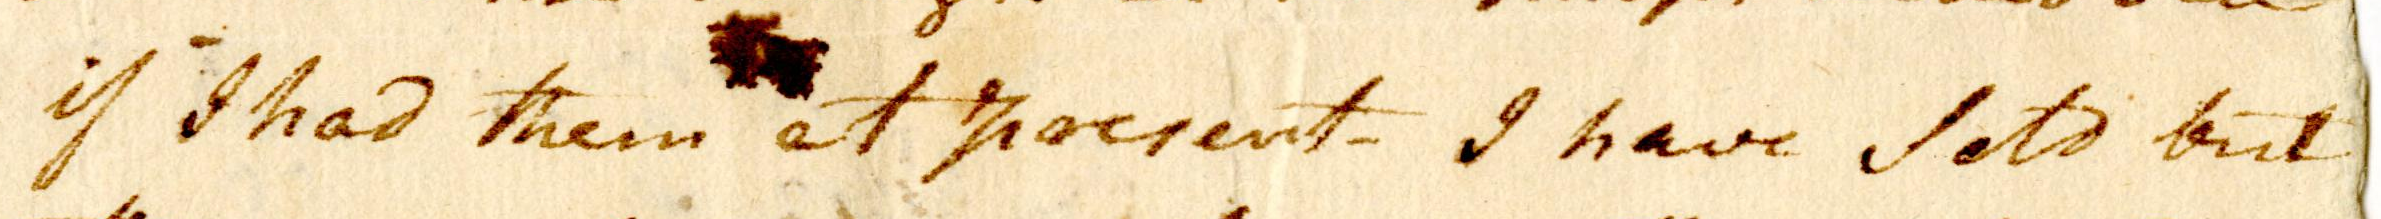if I had them at present. I have sold but
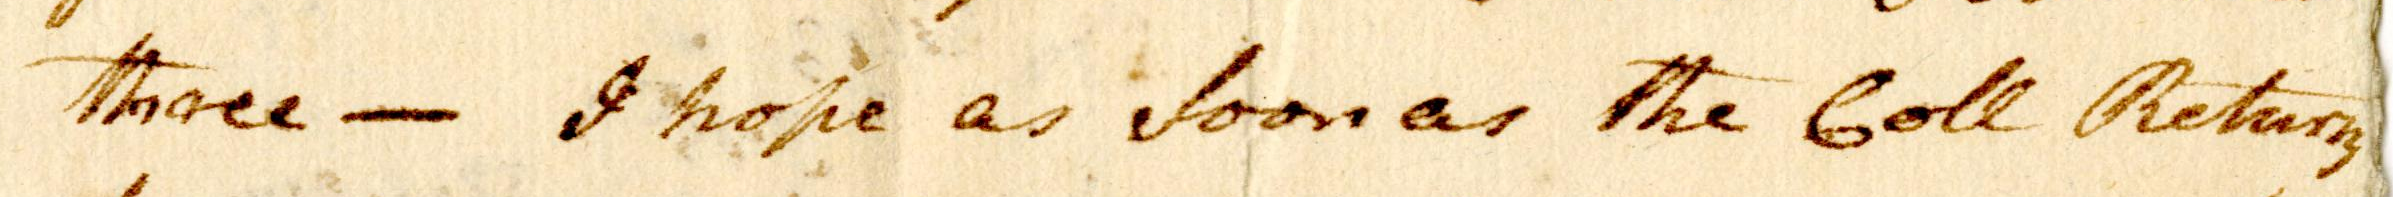three- I hope as soon as the Coll Returns
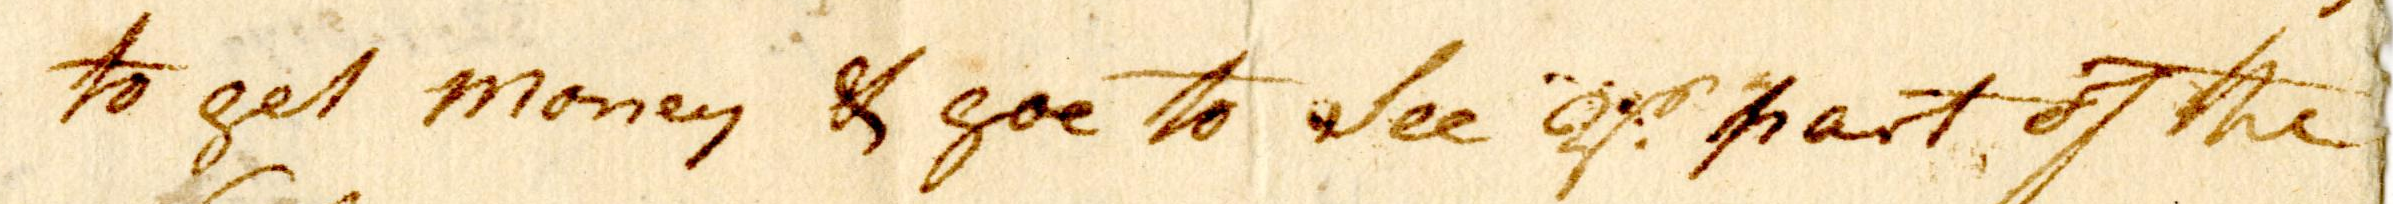to get money & goe to See y^r. part of the
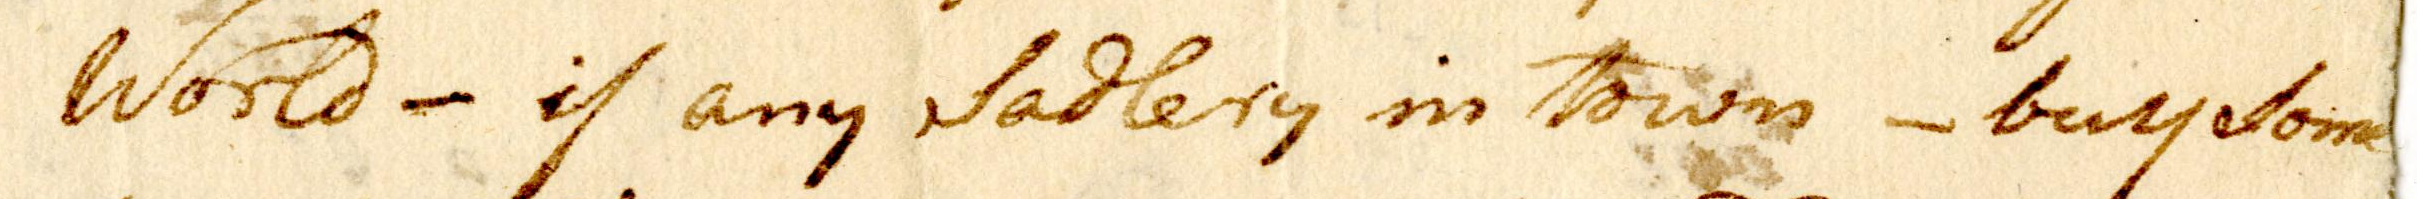World- if any Sadlery in town- buy Some
